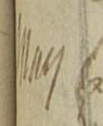May
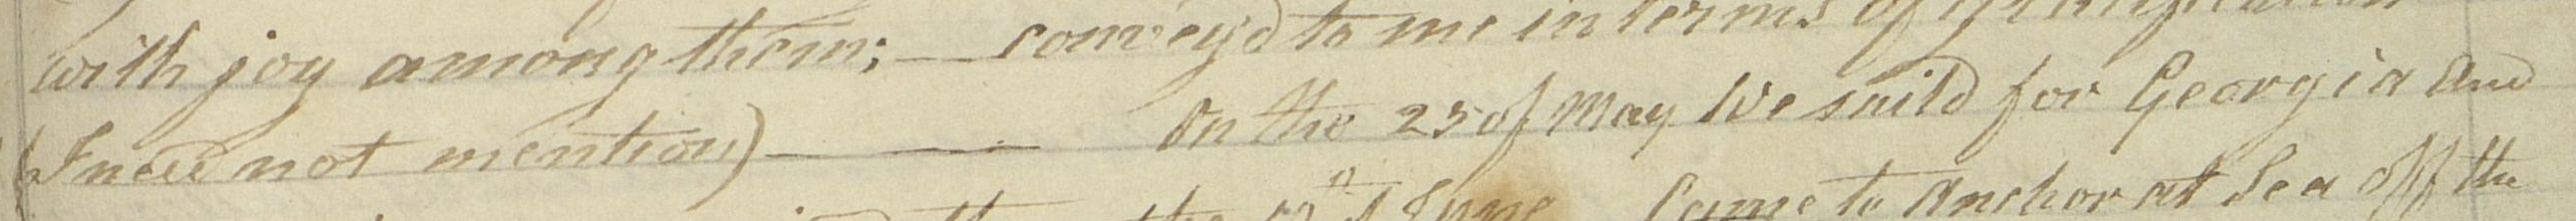(I need not mention) On the 25 of May We saild for Georgia And
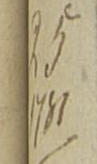25
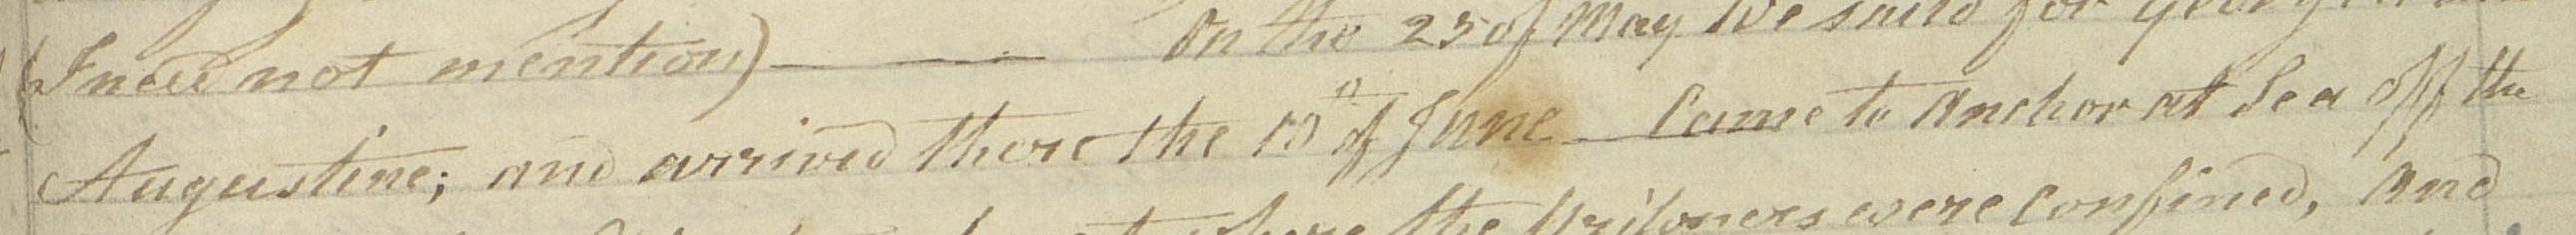Augustine; and arrived there the 13^th of June. Came to anchor at Sea off the
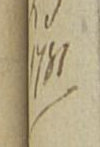1787
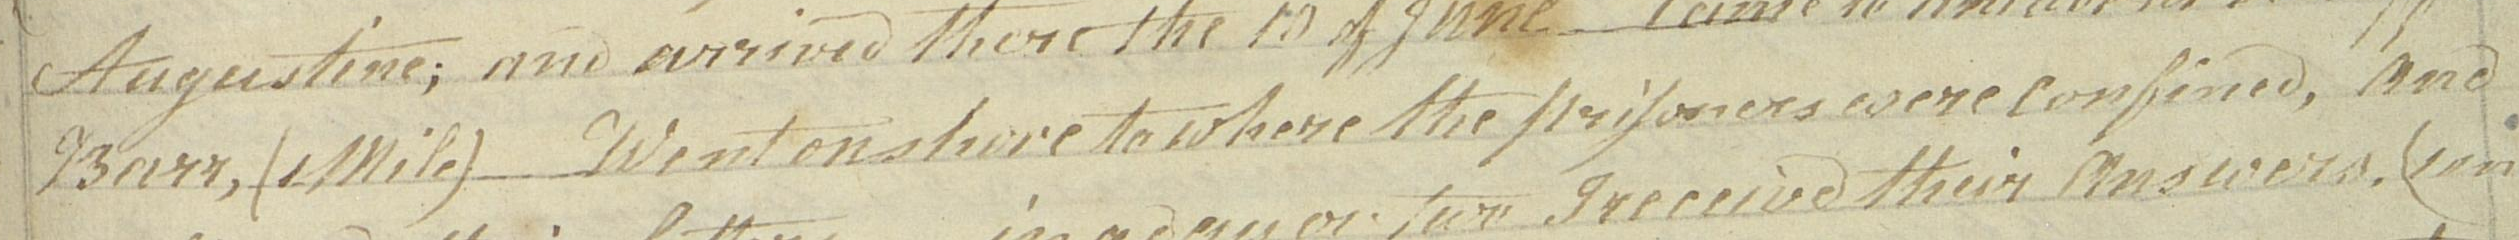Barr (Mile) Went on shore to where the prisoners were confined, and
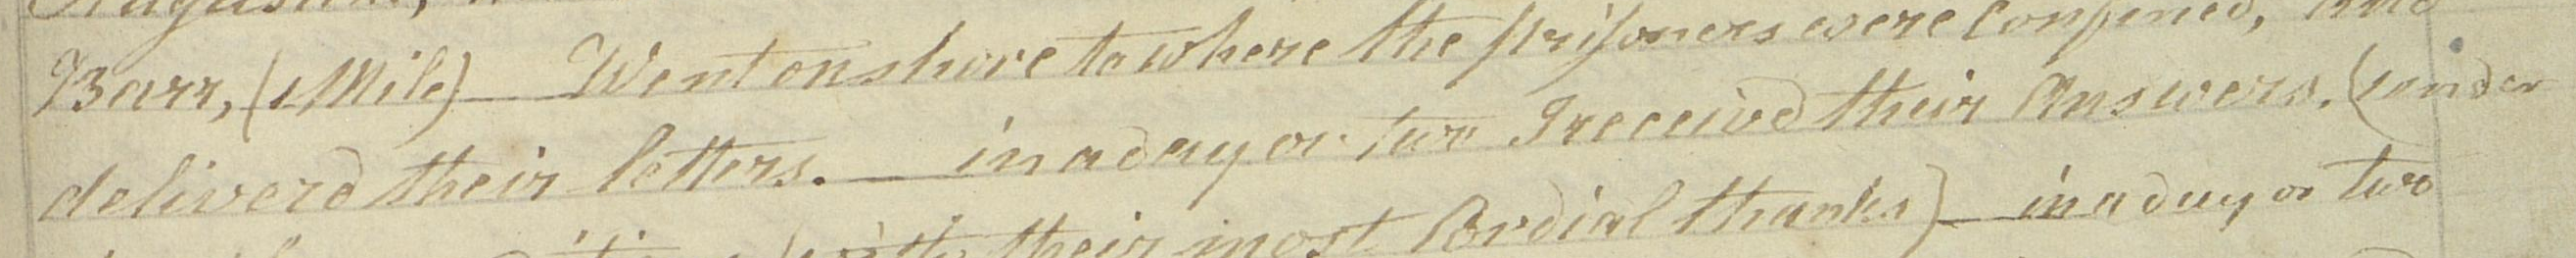delivered their letters. in a day or two I received their Answers, (under
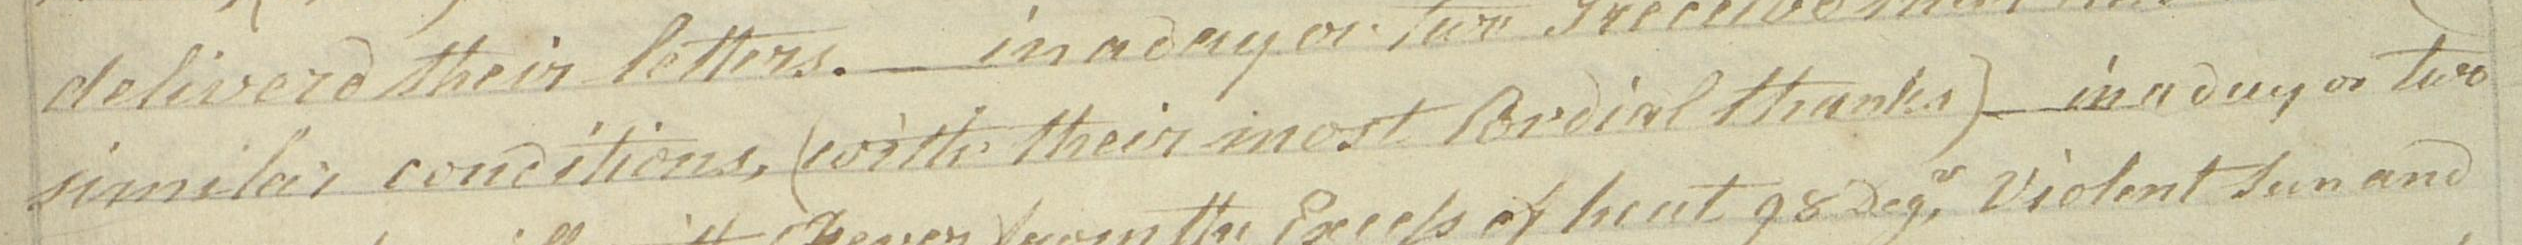similar conditions, (with their most Cordial thanks) in a day or two
